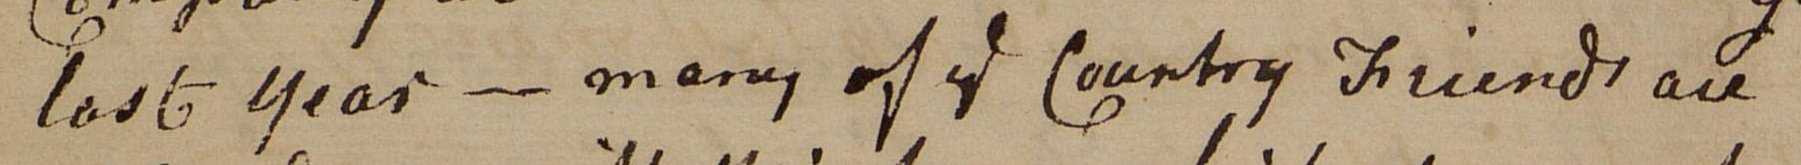last year- many of y^e Country Friends are
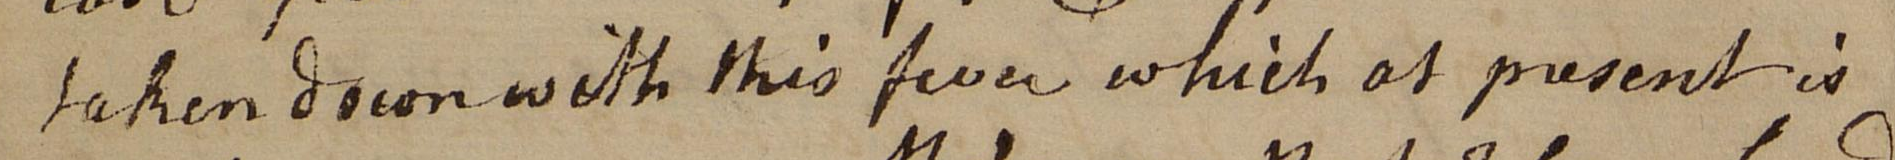taken down with this fever which at present is
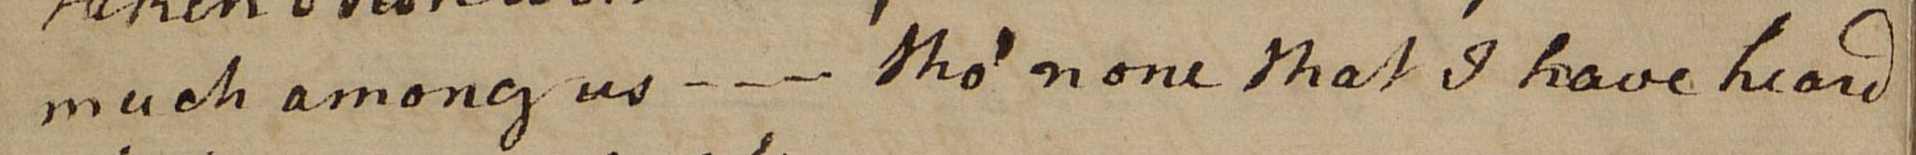much among us-- tho' none that I have heard
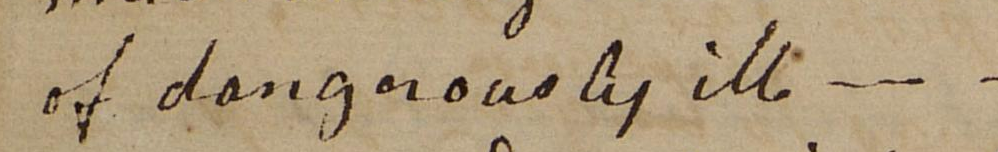of dangerously ill-
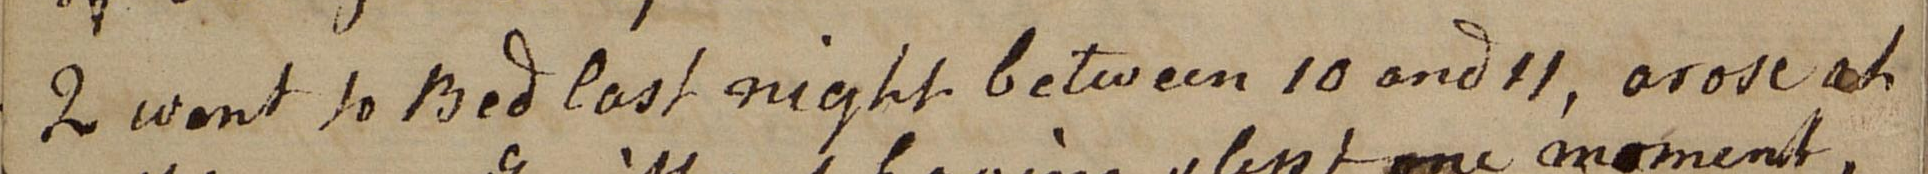2 went to Bed last night between 10 and 11, arose at
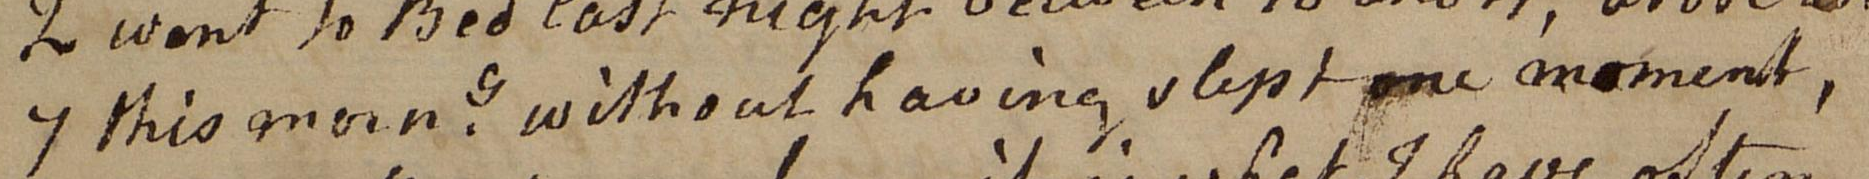7 this morn^g. without having slept one moment,
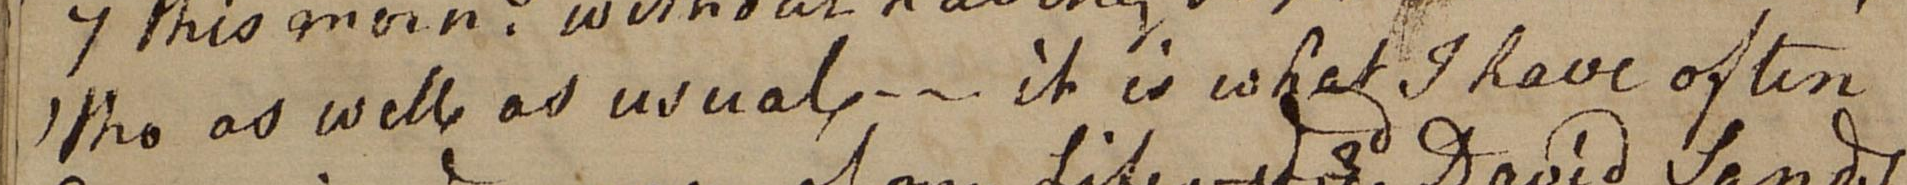'tho as well as usual-- it is what I have often
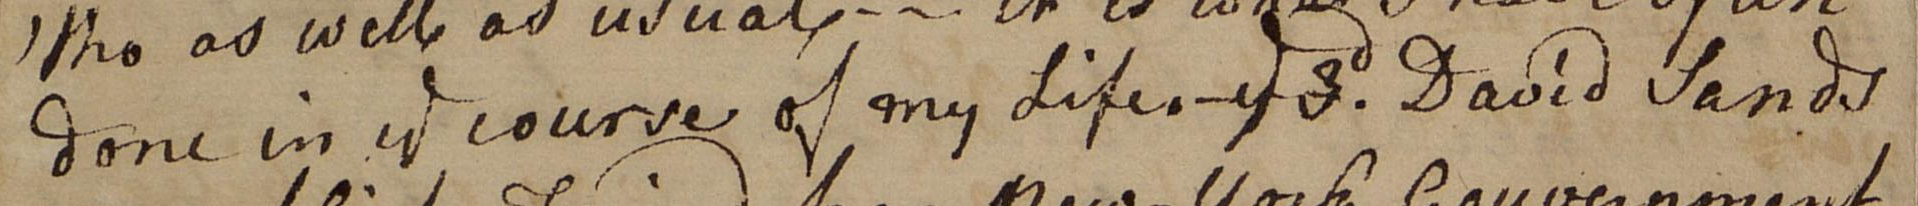done in y^e course of my Life- y^e 3^d. David Sands
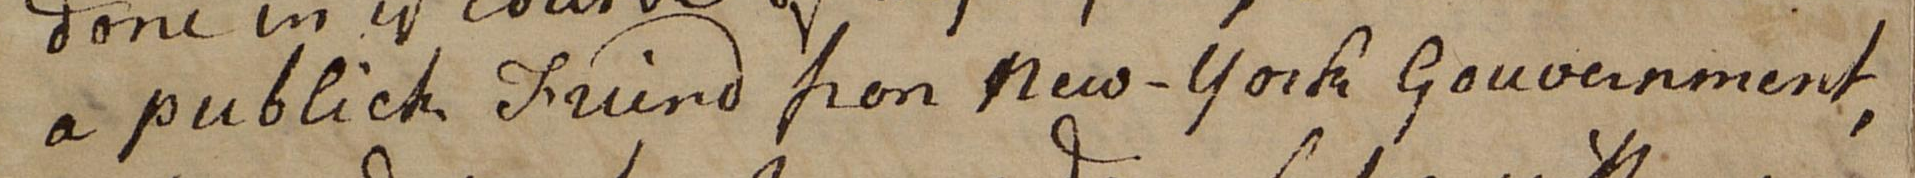a publick Friend from New-York Gouvernment,
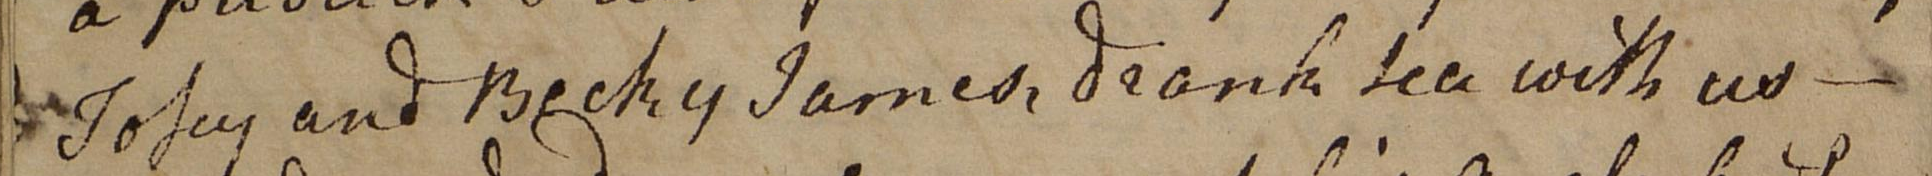Josey and Becky James, drank tea with us-
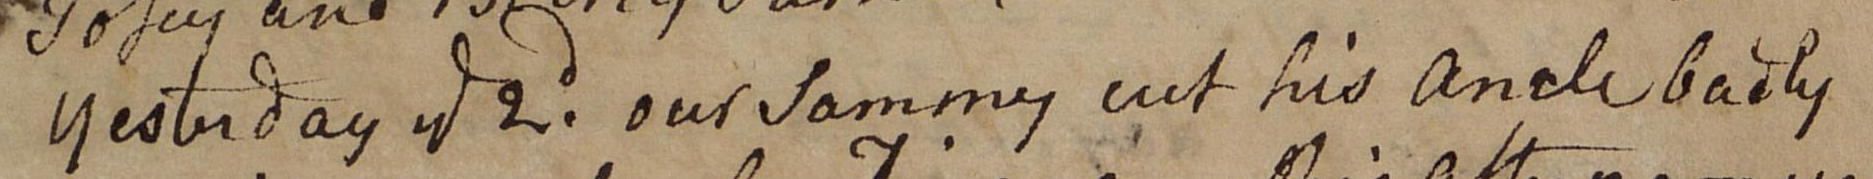Yesterday y^e 2^d. our Sammy cut his Ancle badly
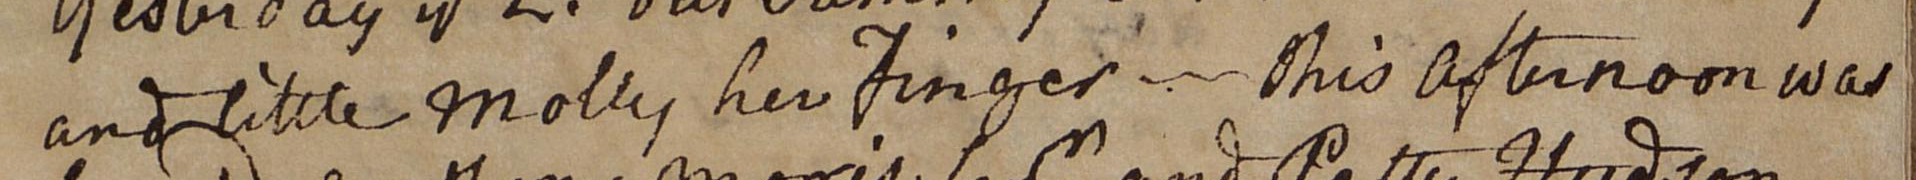and little Molly her finger-- This afternoon was
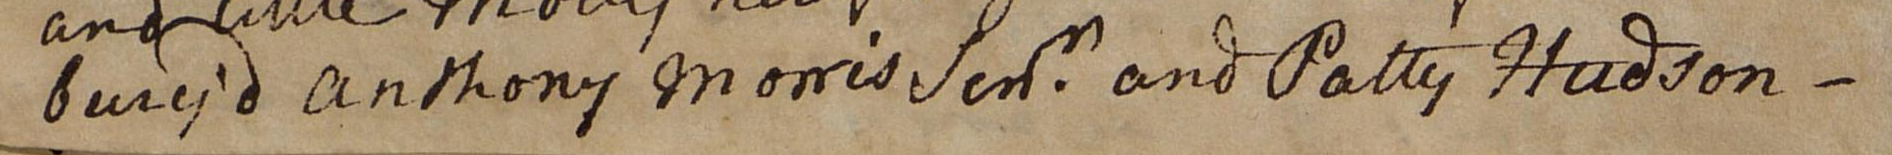bury'd Anthony Morris Sen^r. and Patty Hudson-
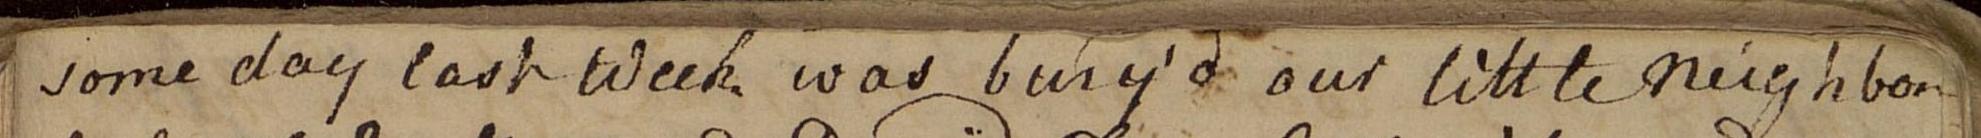some day last Week was bury'd our little Neighbor
